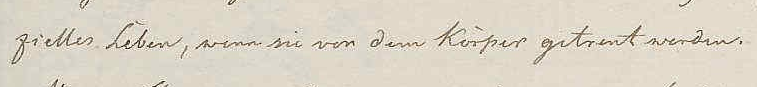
zielles Leben, wenn sie von dem Körper getrent werden.
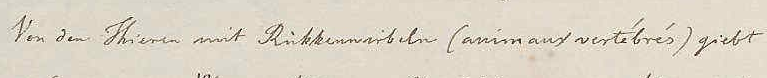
Von den Thieren mit Rükkenwirbeln giebt
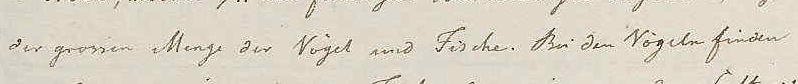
der grossen Menge der Vögel und Fische. Bei den Vögeln finden
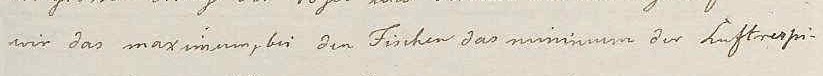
wir das maximum, bei den Fischen das minimum der Luftrespi-
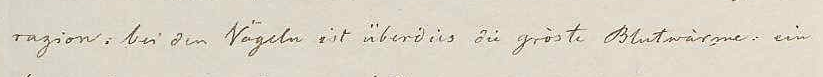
razion: bei den Vögeln ist überdies die gröste Blutwärme: ein
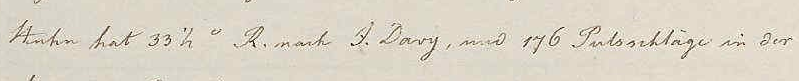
Huhn hat 33½° R. nach J. Davy, und 176 Pulsschläge in der
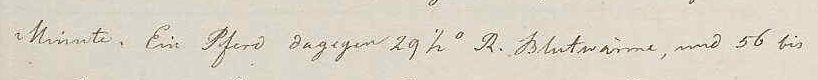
Minute. Ein Pferd dagegen 29½° R. Blutwärme, und 56 bis
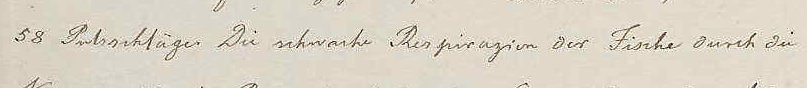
58 Pulsschläge. Die schwache Respirazion der Fische durch die
